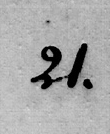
2.
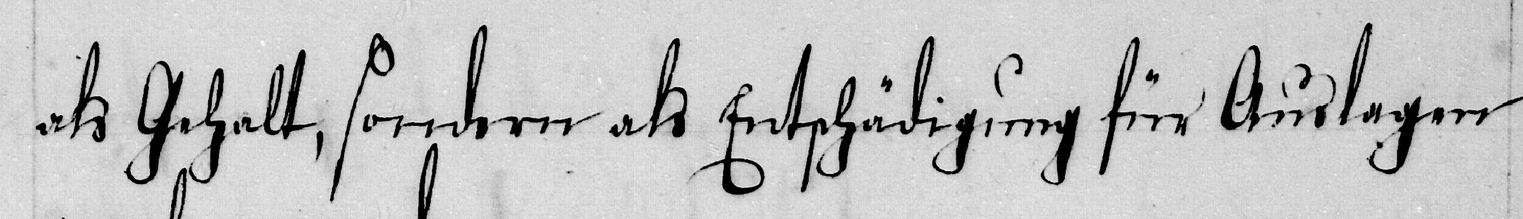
als Gehalt, sondern als Entschädigung für Auslagen
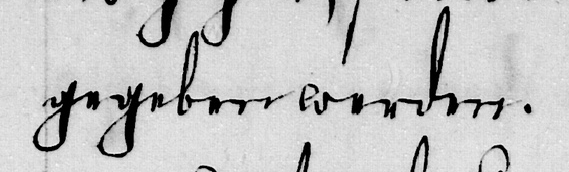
gegeben werden.
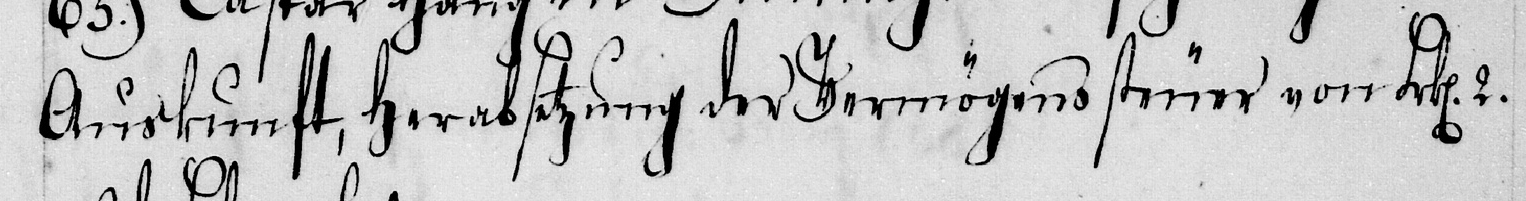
Auskunft, Herabsetzung der Vermögenssteuer von Frk[e¬
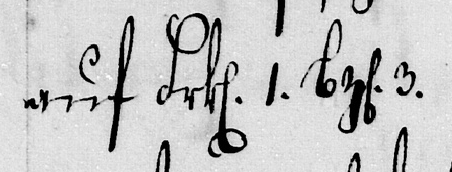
auf genügende
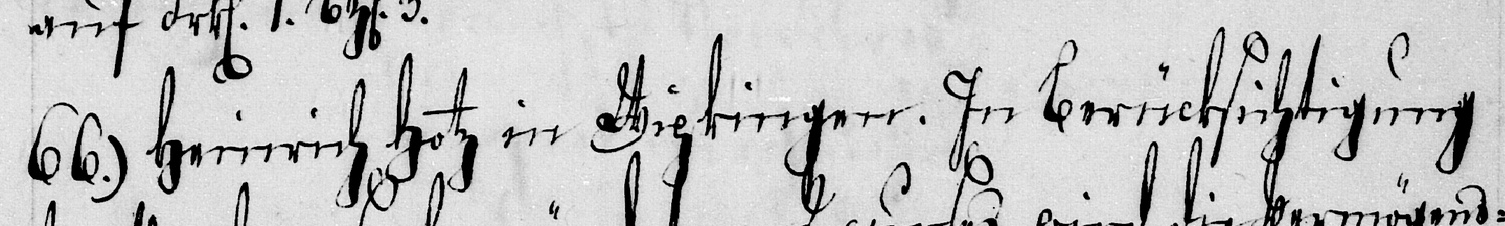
66.) Heinrich Hotz in Wipkingen. In Berücksichtigung
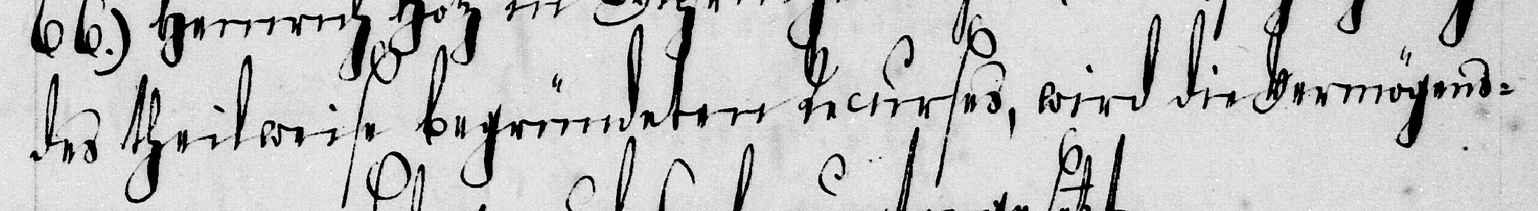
des theilweise begründeten Recurses, wird die Vermögens¬
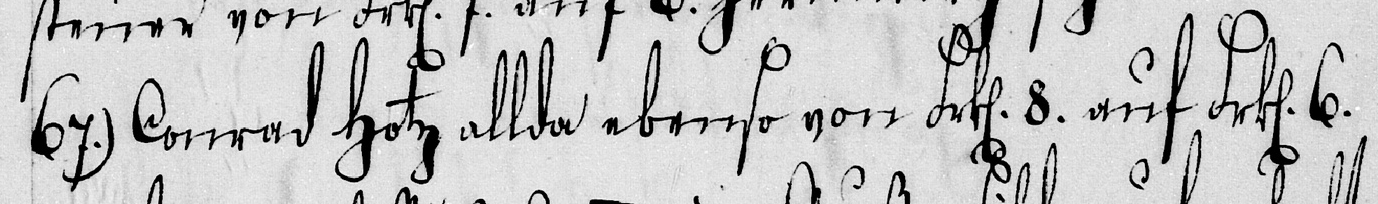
67.) Conrad Hotz allda ebenso von Frk[en]. 8.
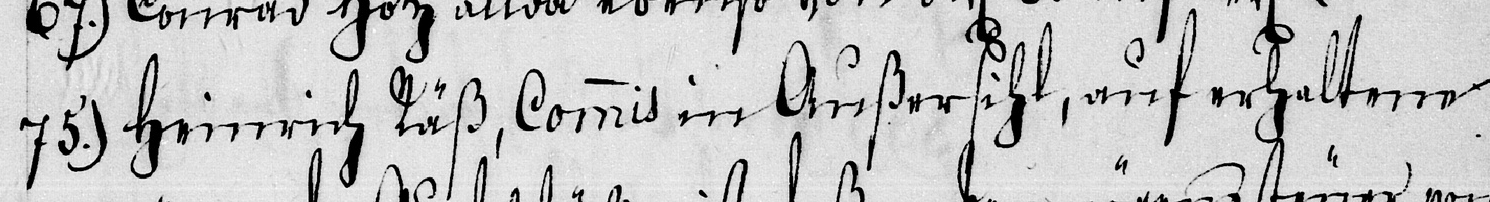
75.) Heinrich Räß, Commis in Außersihl, auf erhaltene
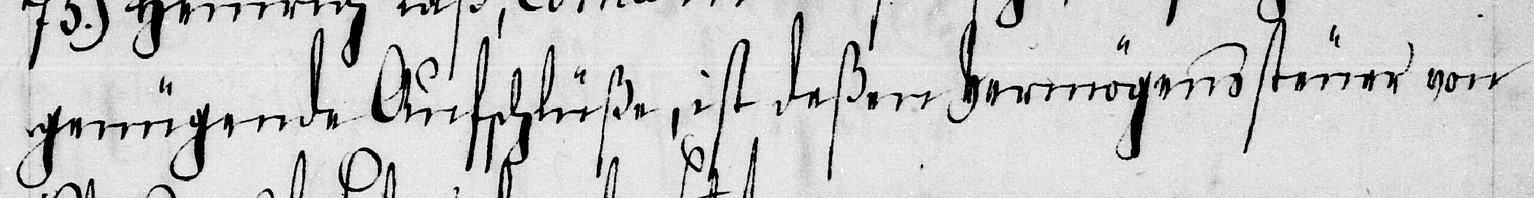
genügende Aufschlüße, ist deßen Vermögenssteuer von
